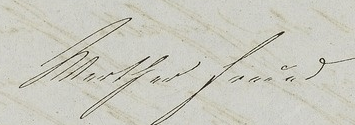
Werther Freund
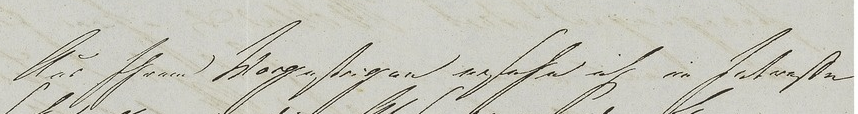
Aus Ihrem Vorgestrigen ersehe ich im Interesse
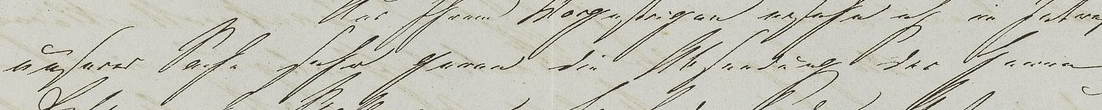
unserer Sache sehr gerne die Absendung des Herrn
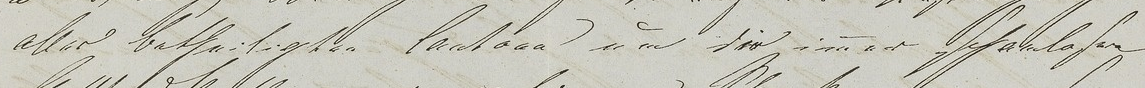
aller betheiligten Cantone, um die immer schamlosere
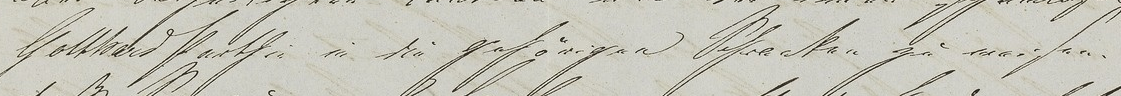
Gotthard Parthie in die gehörigen Schranken zu weisen.
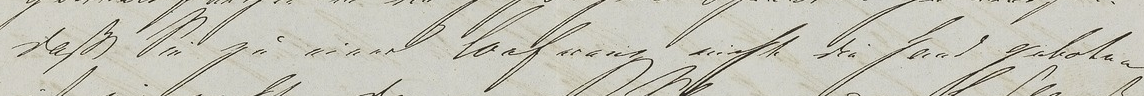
Daß Sie zu einer Conferenz nicht die Hand geboten
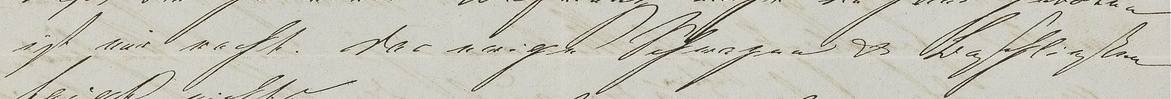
ist mir recht. Das ewige Schwazen & Beschließen
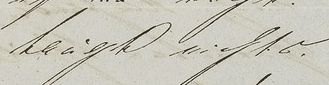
bringt nichts.
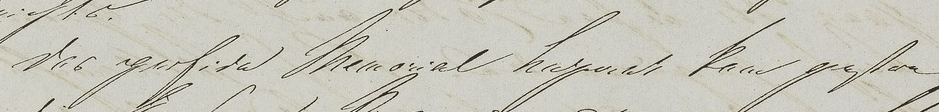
Das perfide Memorial Lepores kam gestern
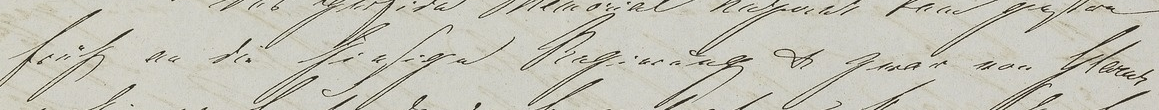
früh an die hiesige Regierung & zwar von Glarus
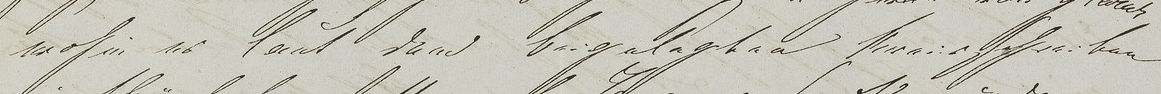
wohin es laut dem beigelegten Kreisschreiben
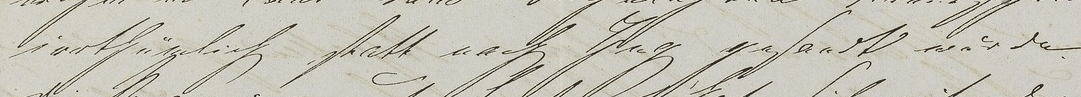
irrthümlich statt nach Zug gesandt wurde.
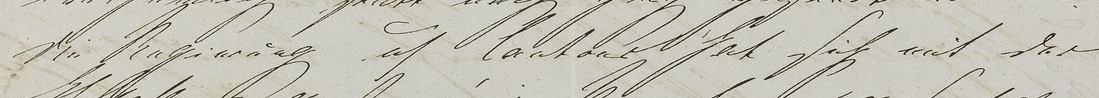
Die Regierung us Cantons hat sich mit der
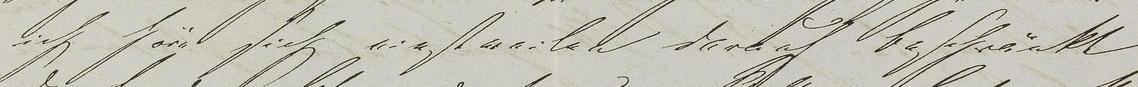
ich höre sich einstweilen darauf beschränkt
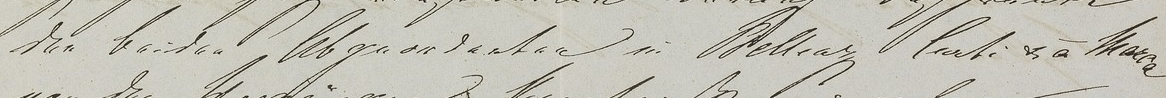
die beiden Abgeordneten in BellenzCurti & à Marca
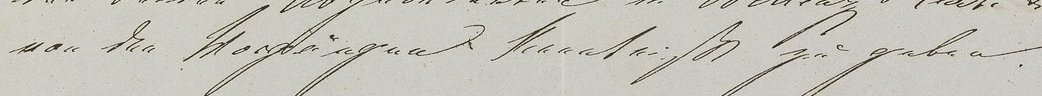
von den Vorgängen Kenntniß zu geben.
